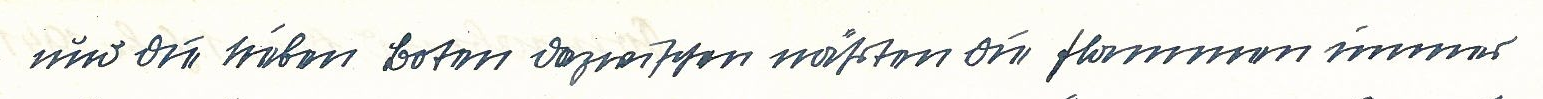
und die lieben Boten dazwischen nährten die Flammen immer
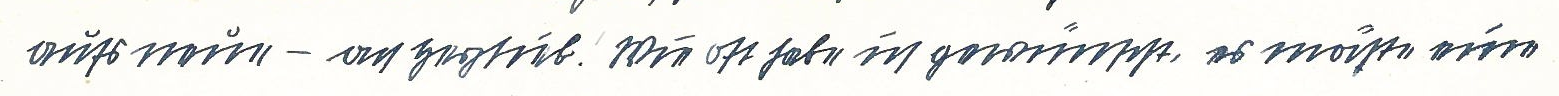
aufs neue – ach Herzlieb. Wie oft habe ich gewünscht, es möchte eine
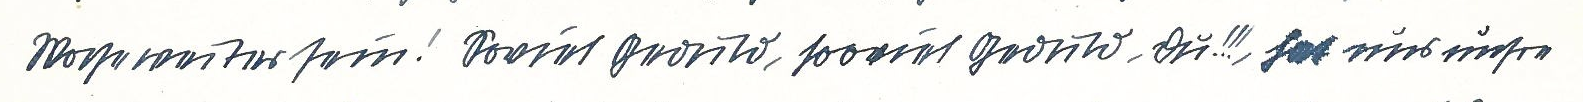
Woche weiter sein! Soviel Geduld, soviel Geduld, Du!!!, hat unsre
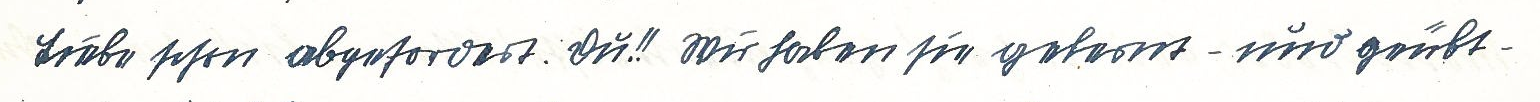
Liebe schon abgefordert. Du!! Wir haben sie gelernt – und geübt –
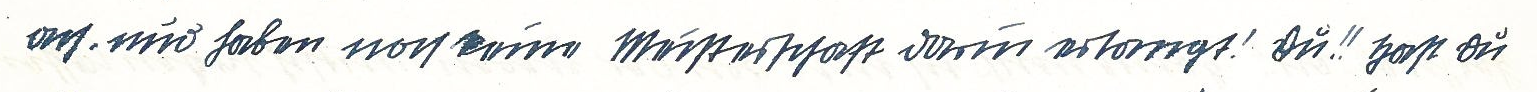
ach, und haben noch keine Meisterschaft darin erlangt! Du!! Hast Du
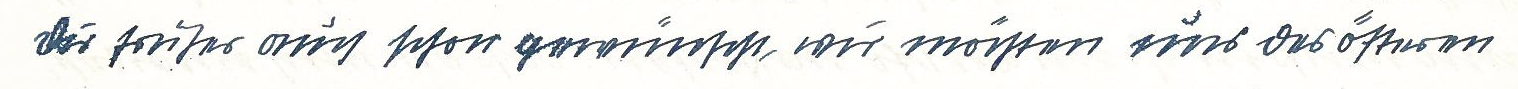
Dir früher auch schon gewünscht, wir möchten uns des öfteren
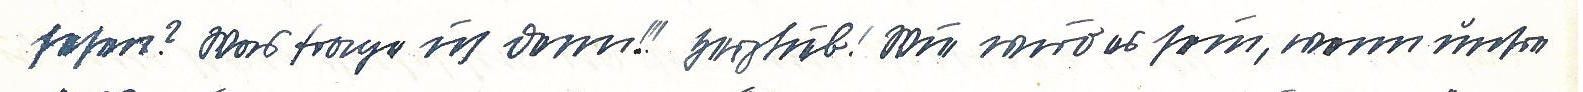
sehen? Was frage ich denn!!! Herzlieb! Wie wird es sein, wenn unsre
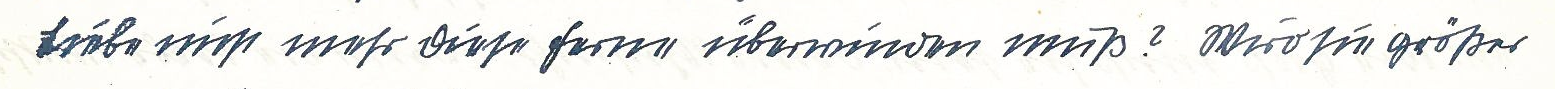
Liebe nicht mehr diese Ferne überwinden muß? Wird sie größer
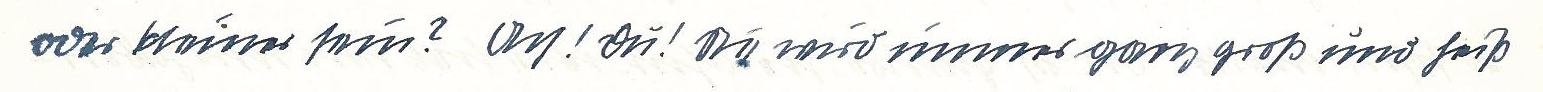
oder kleiner sein? Ach! Du! Sie wird immer ganz groß und heiß
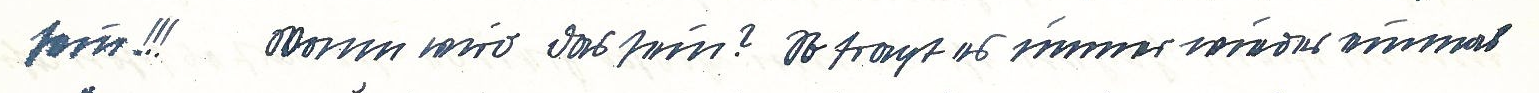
sein!!! Wann wird es sein? So fragt es immer wieder einmal
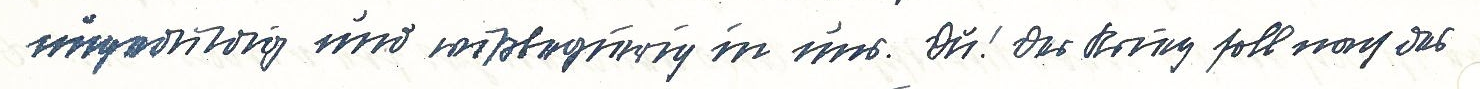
ungeduldig und wißbegierig in uns. Du! Der Krieg soll nach des
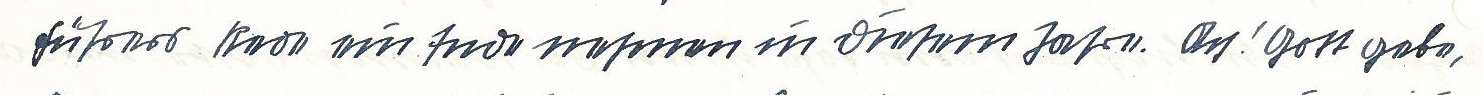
Führers Rede ein Ende nehmen in diesem Jahre. Ach! Gott gebe,
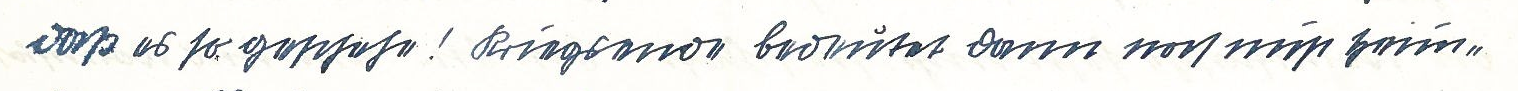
daß es so geschehe! Kriegsende bedeutet dann noch nicht Heim¬
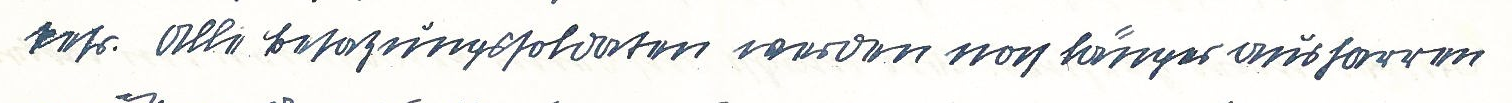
kehr. Alle Besatzungssoldaten werden noch länger ausharren
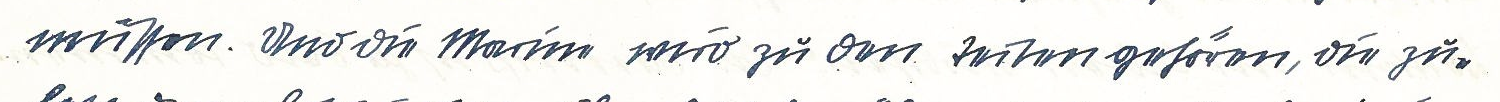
müssen. Und die Marine wird zu den Teilen gehören, die zu¬
